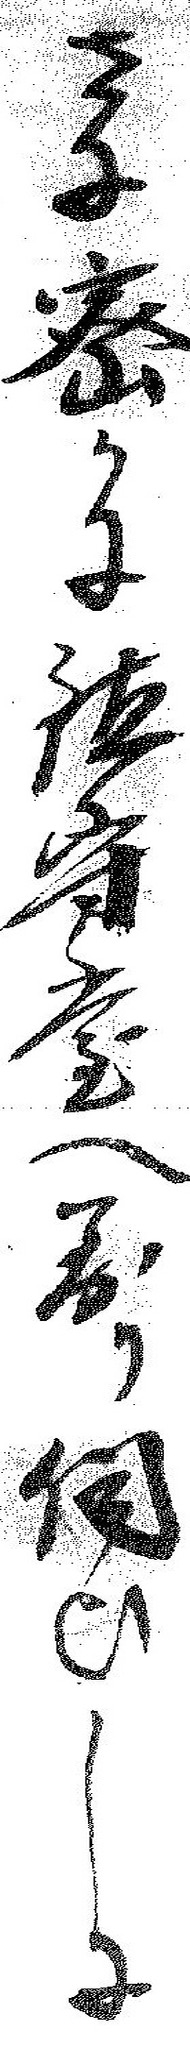さに密かに鎮守堂へ至り伺ひしに
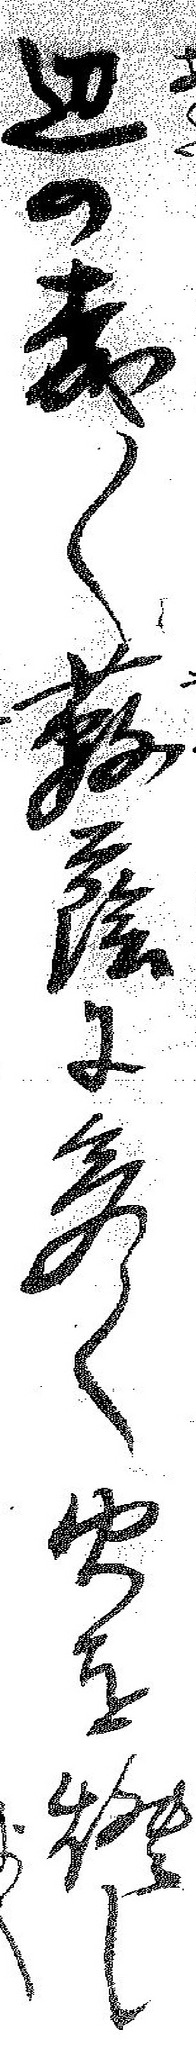辺の森〳〵藪蔭に多く火を燈し
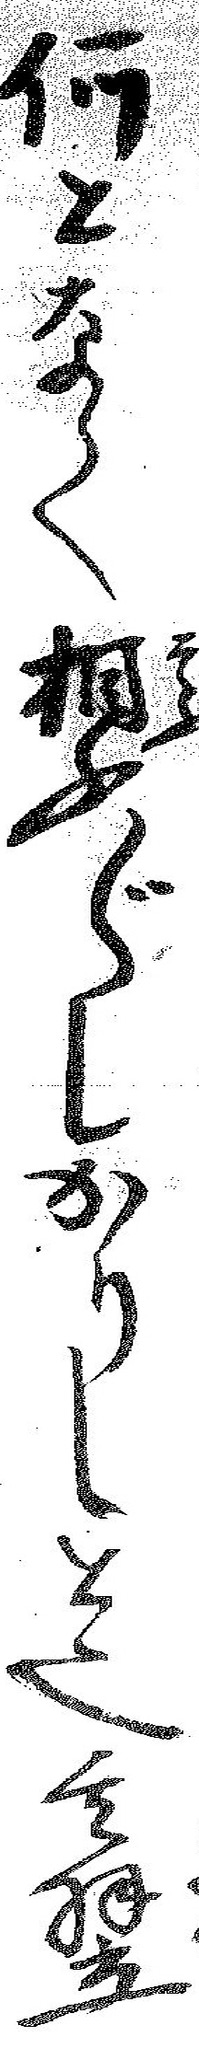何となく想〴〵しかりしと也其翌
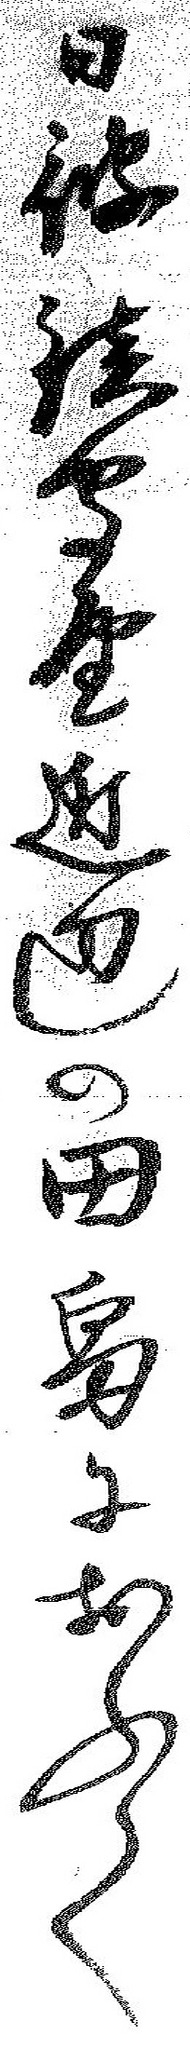日彼鎮守堂近辺の田畠におふく
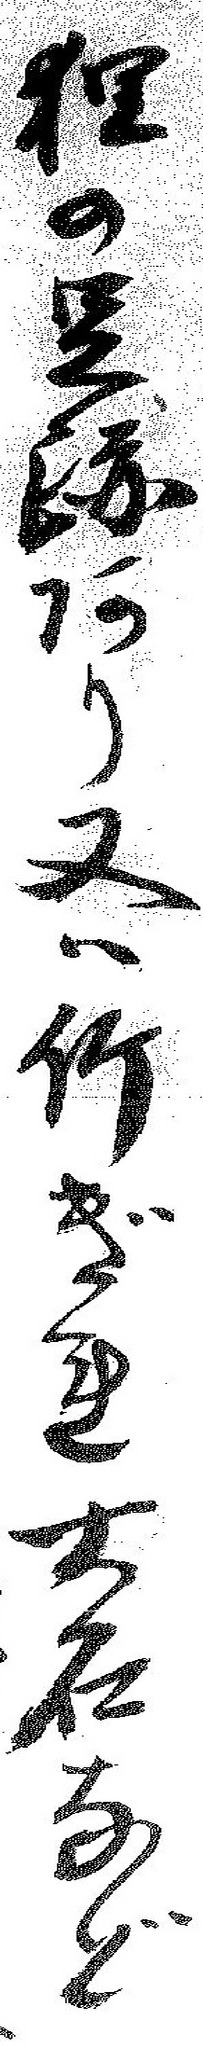狸の足跡あり又は竹ぎれ大石など
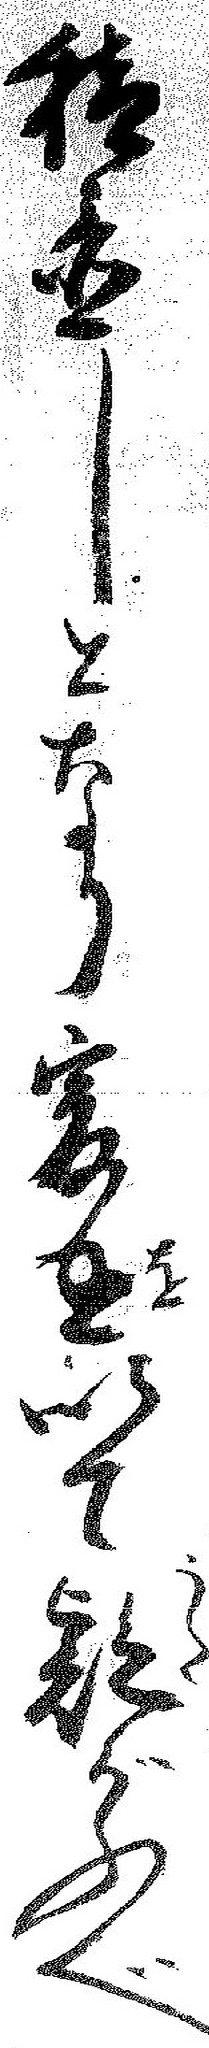積置しとなり爰以て疑がふべ
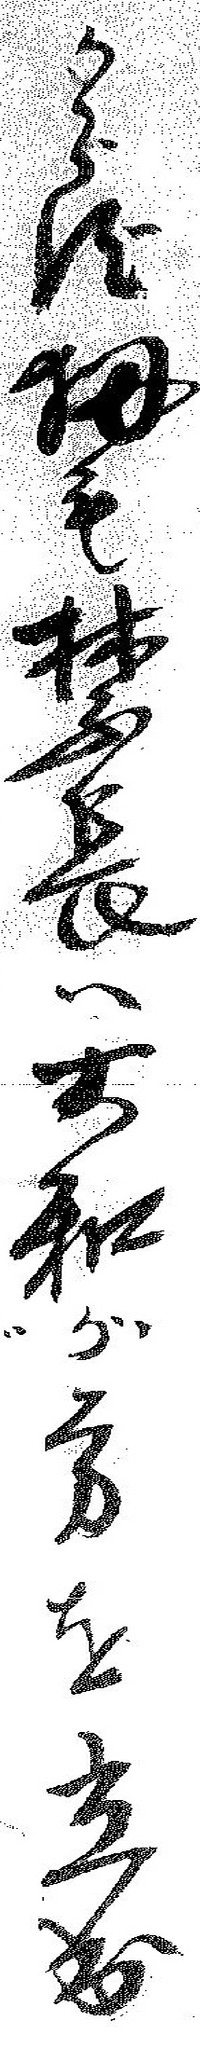からず扨も禁長は大和が方を立出
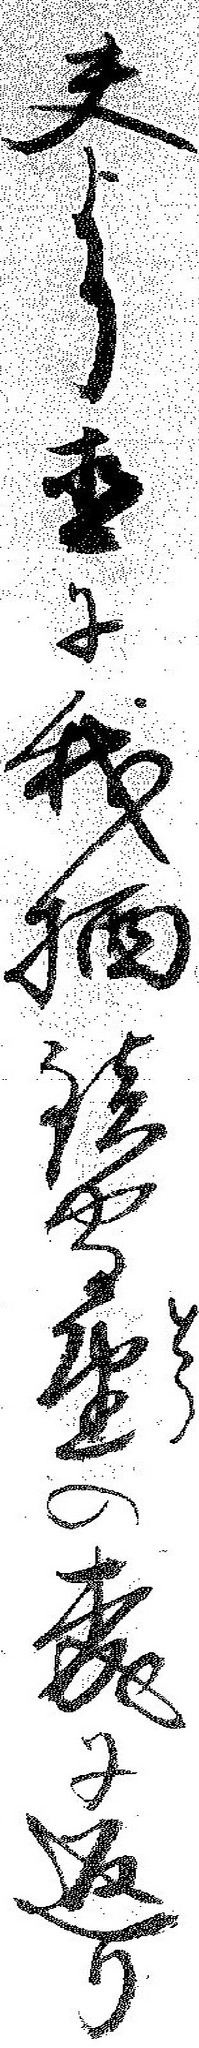夫より直に我栖鎮守堂の森に返り
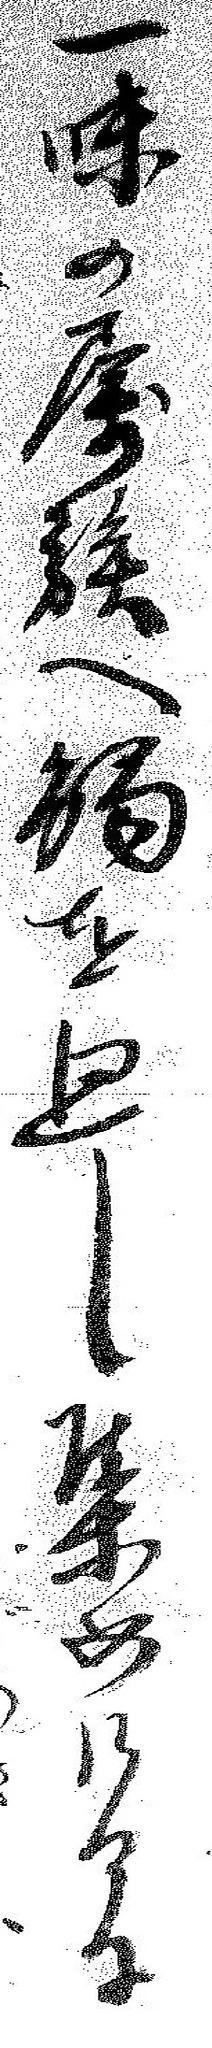一味の属族へ触を廻し集めけるに
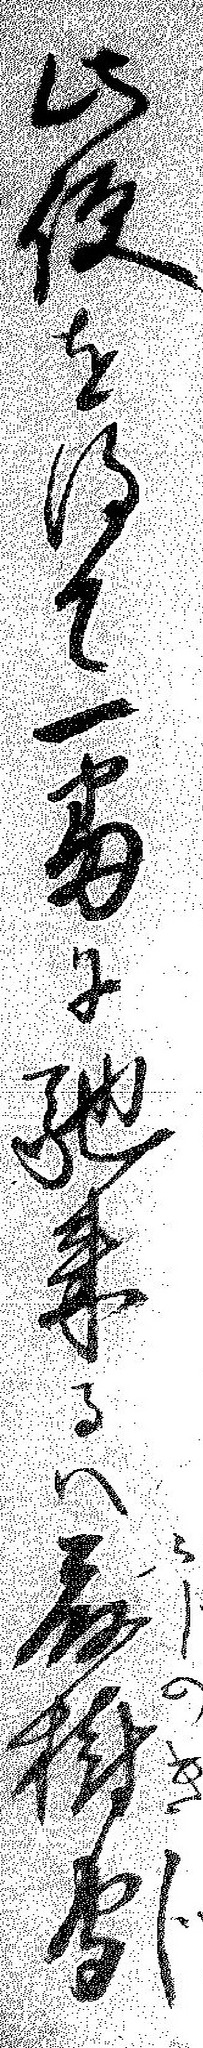此使を得て一番に馳来るは藤樹寺

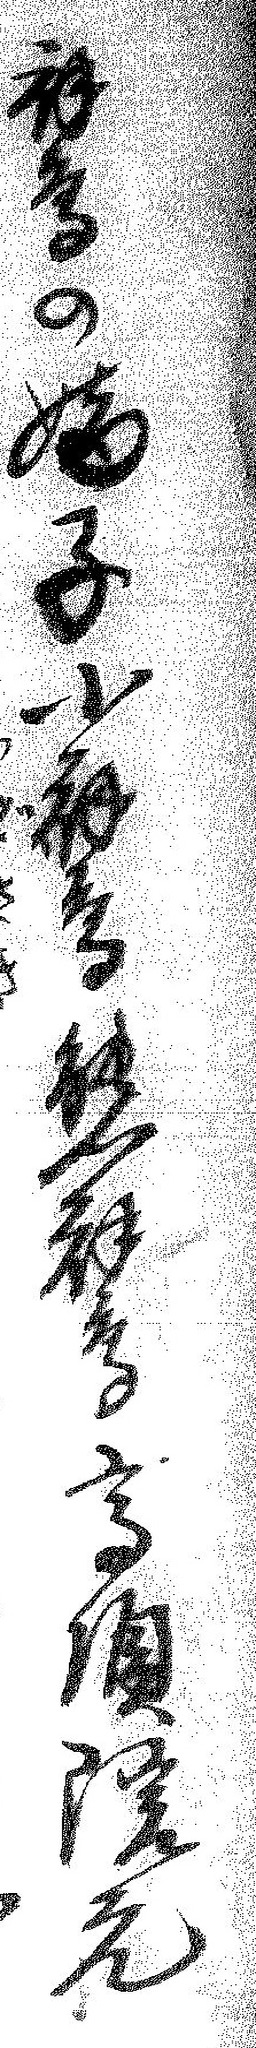鷹の嫡子小鷹熊鷹高須院元
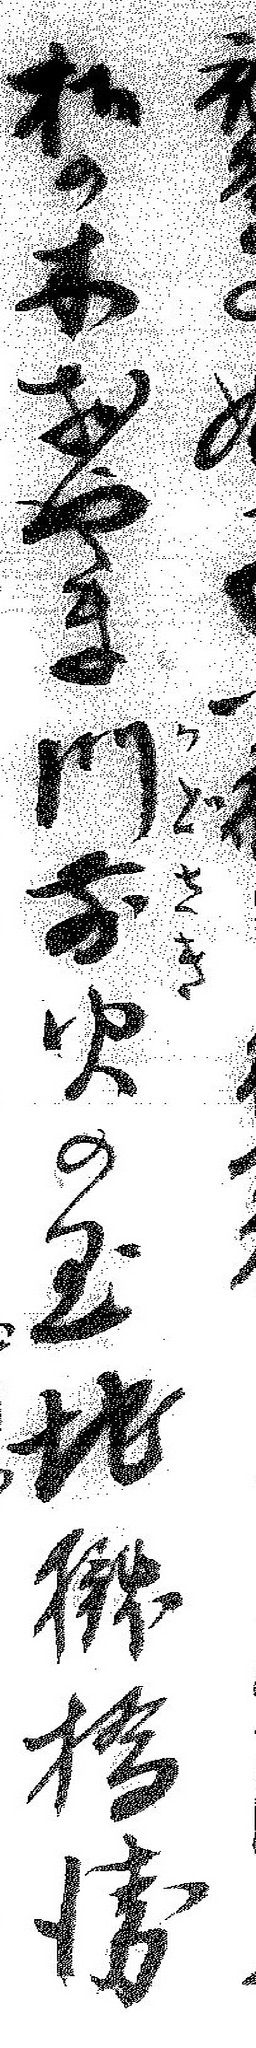松の木おやま門前火の玉地獄橋衛
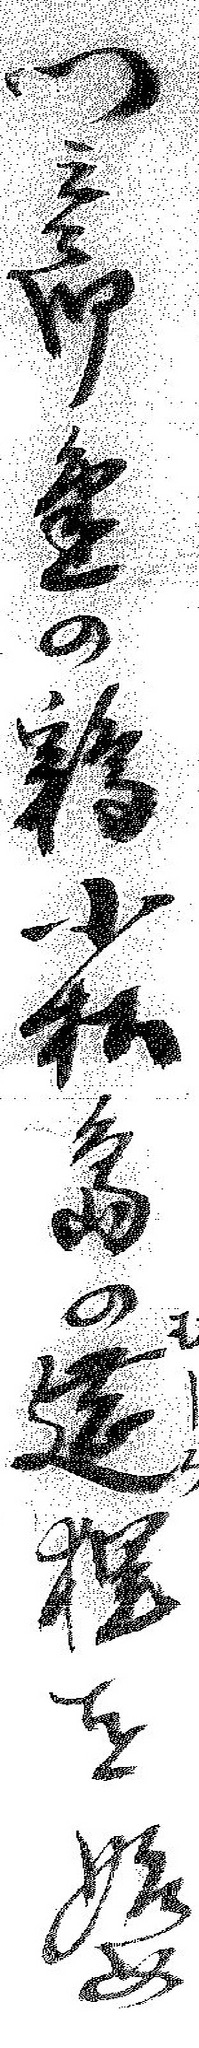門三郎金の鶏小松島の筵狸を始め
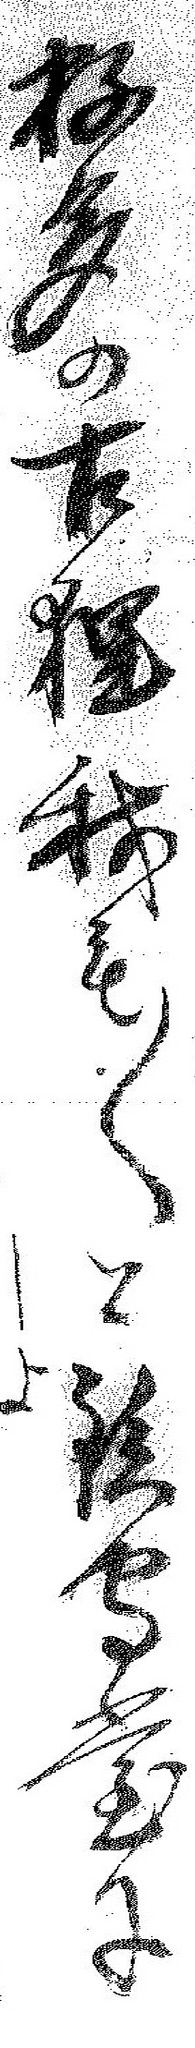数多の古狸我も〳〵と鎮守堂に
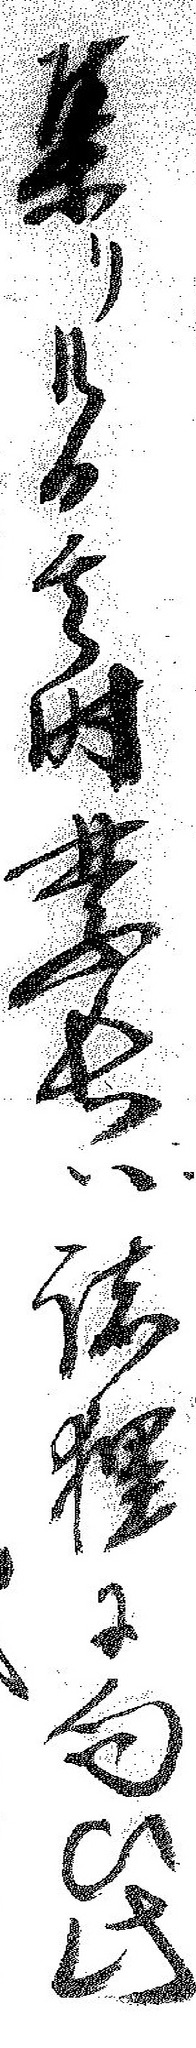集りける其時禁長は諸狸に向ひ此
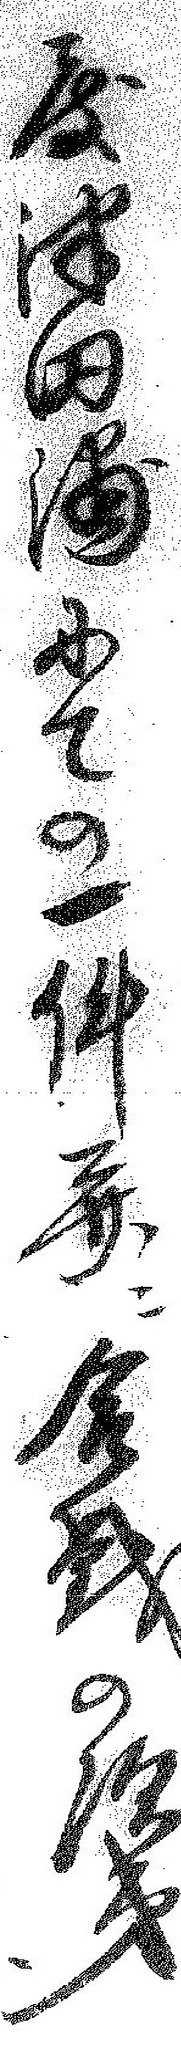度津田浦にての一件并に合戦の次第
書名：近頃古狸珍説　礼義智信
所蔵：徳島県立図書館
